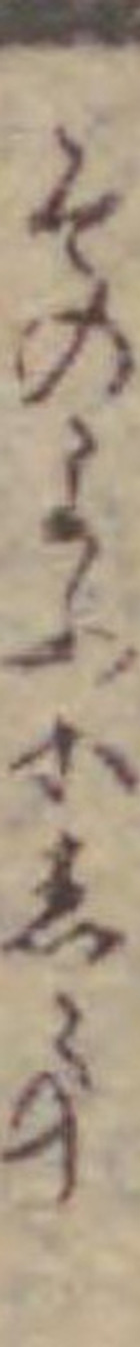そのよふにし事
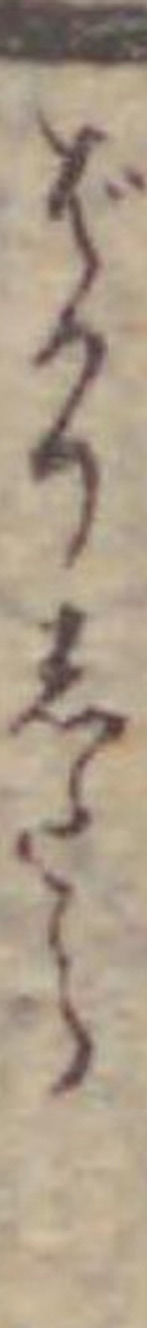ばかりしたら
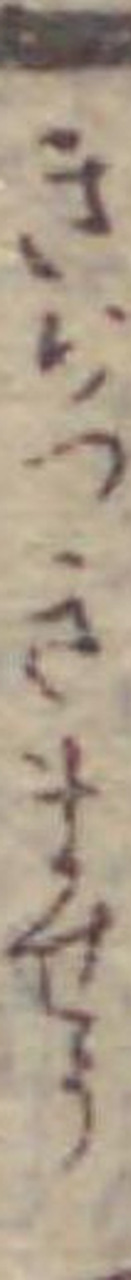きがつきませう
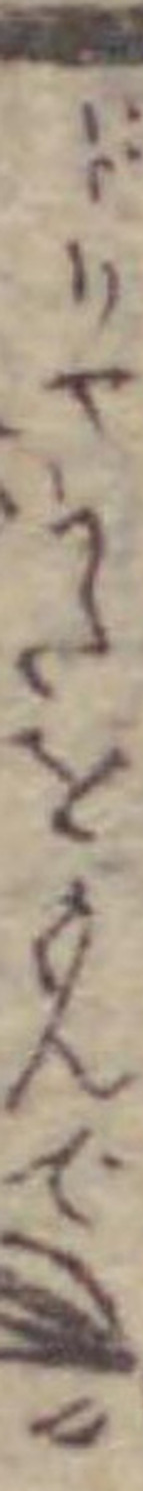ドリヤかたをもんで
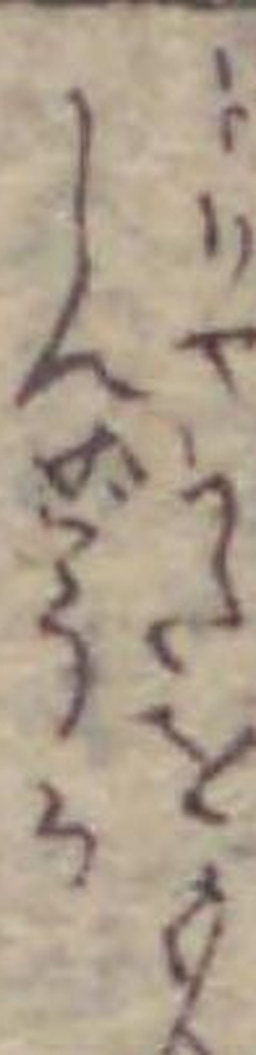しんぜうか
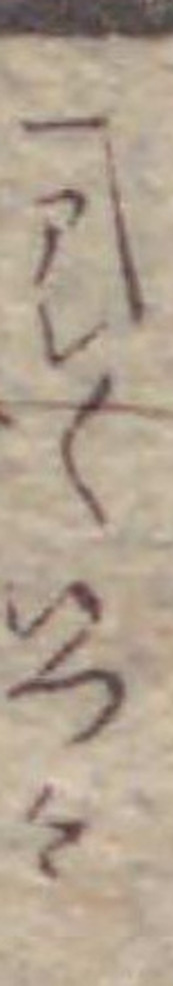〽アレ〳〵いつそ
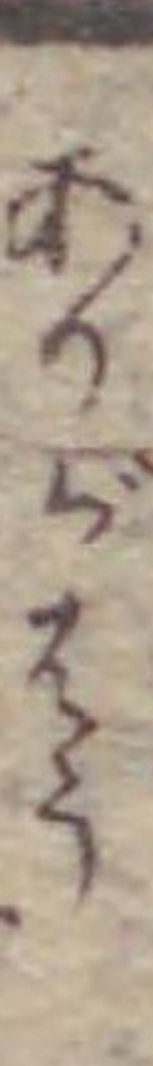ありがはう
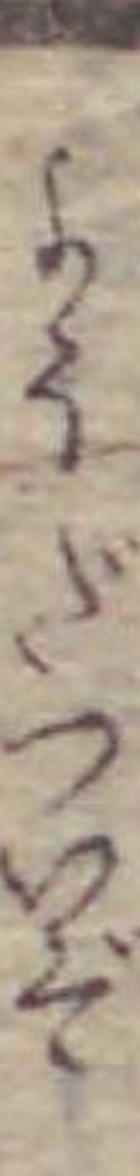ようだついぞ
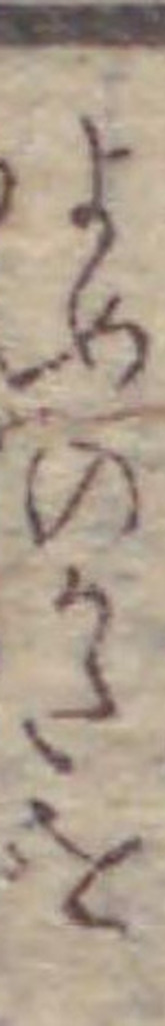よめのかたを
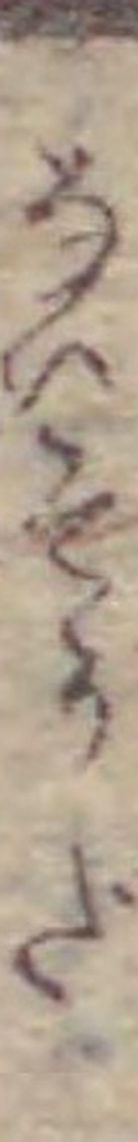ないそうだ
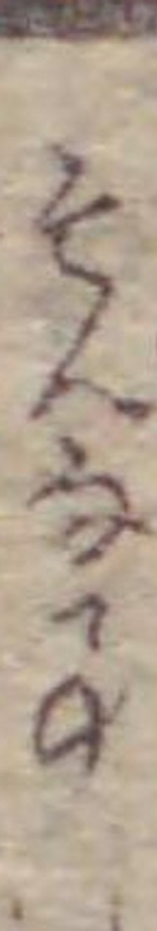そんな事
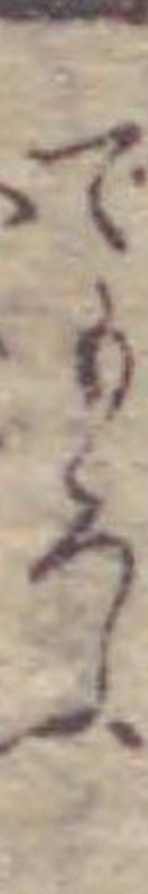でもろふ

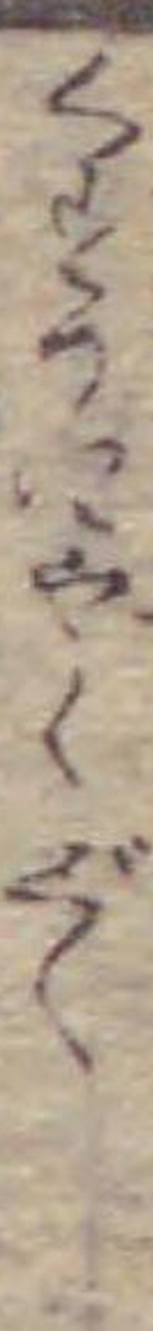くすりにやくどく
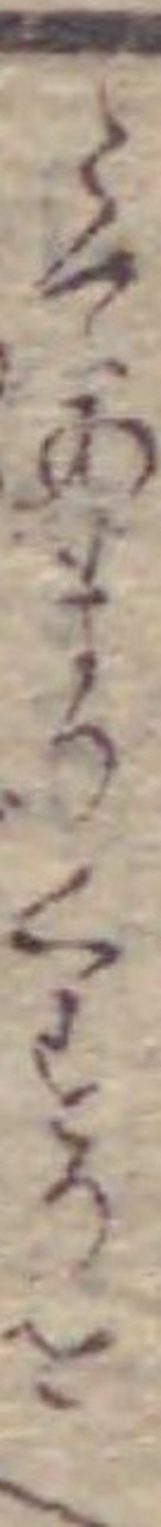とてあまりくすりを
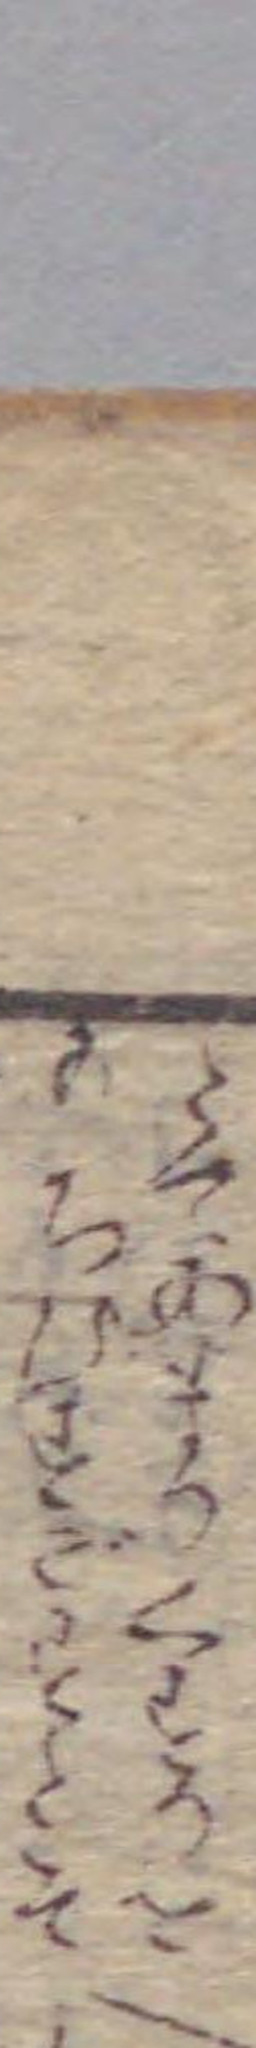もちいすごすとそ
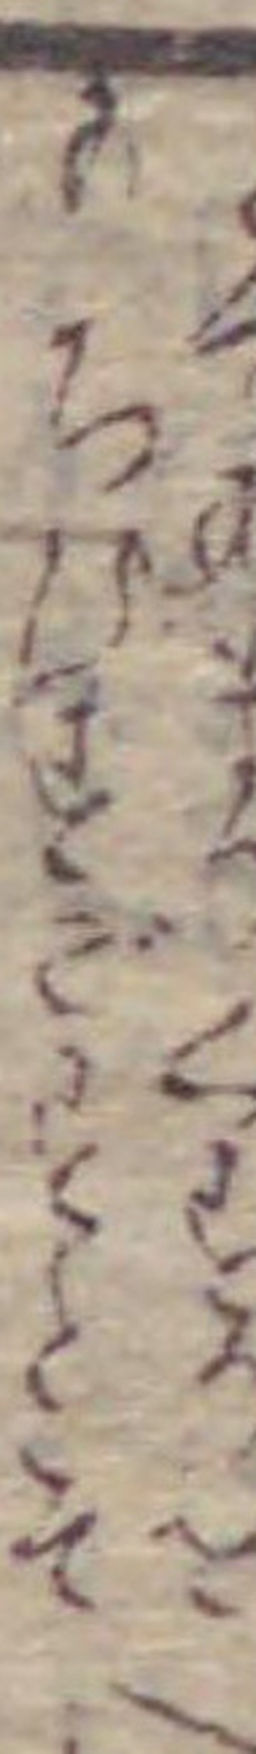もちいすごすとそ
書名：鼻下長生薬 : 3巻
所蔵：国立国会図書館 National Diet Library, JAPAN
